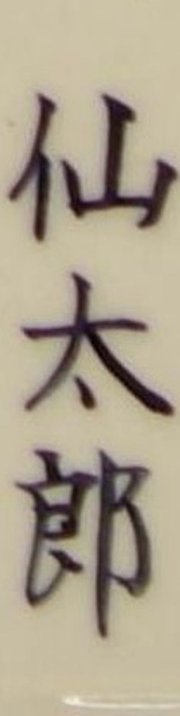仙太郎
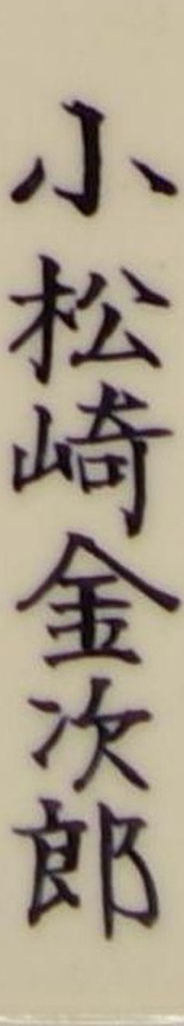小松崎金次郎
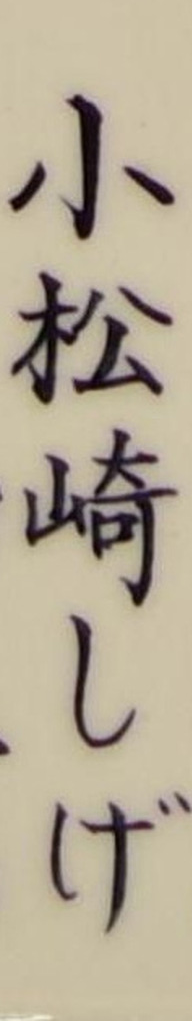小松崎しげ
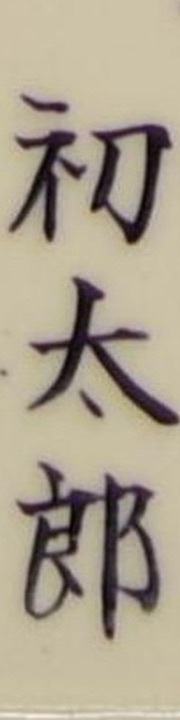初太郎
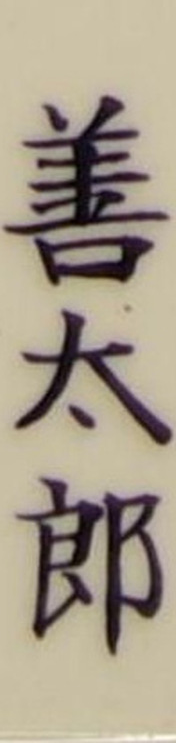善太郎
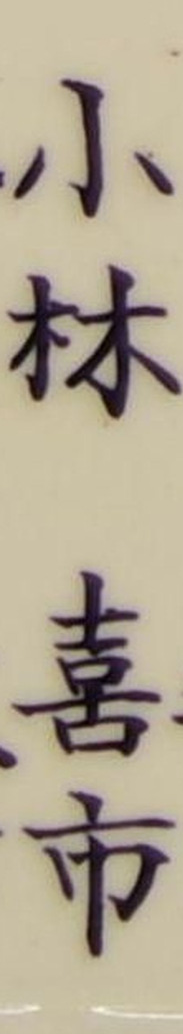小林喜市
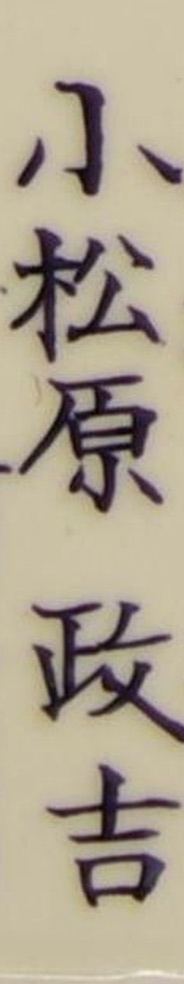小松原政吉
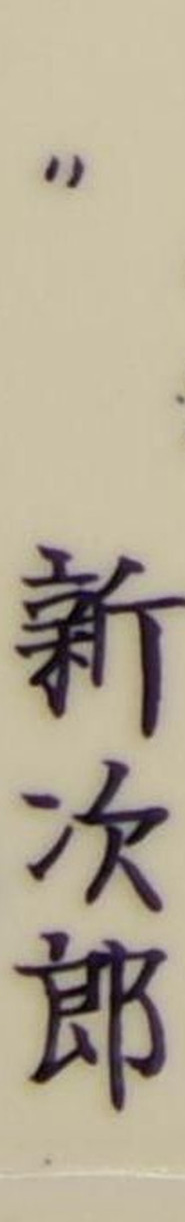新次郎
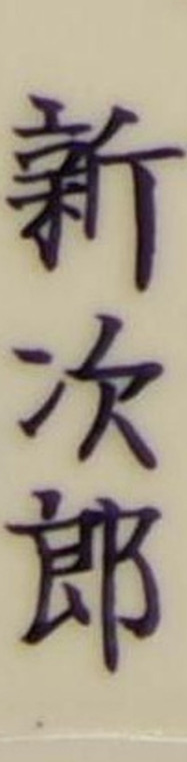新次郎

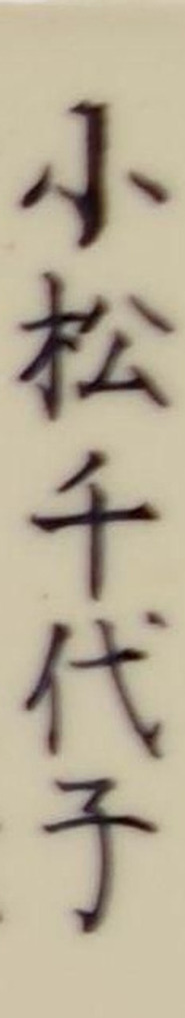小松千代子
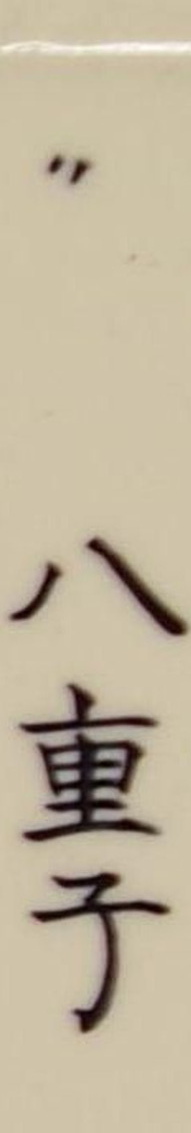八重子
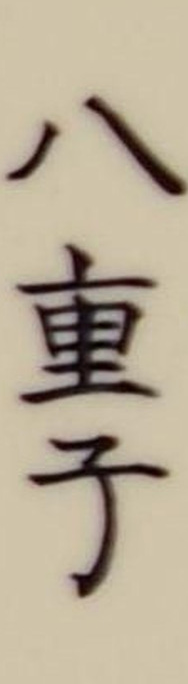八重子
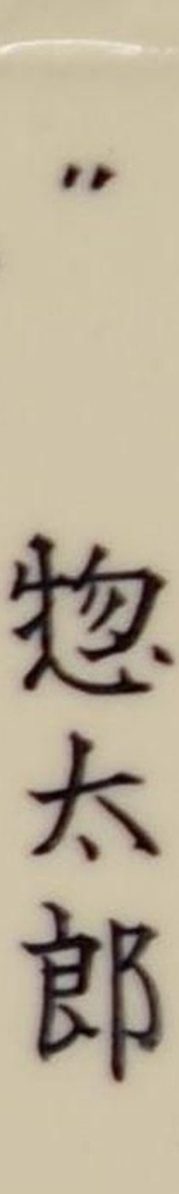惣太郎
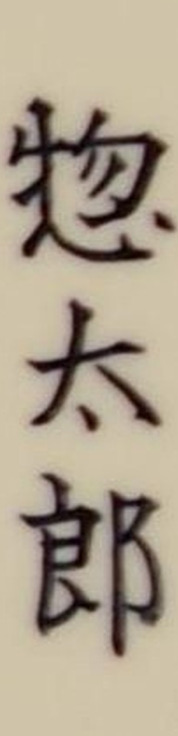惣太郎
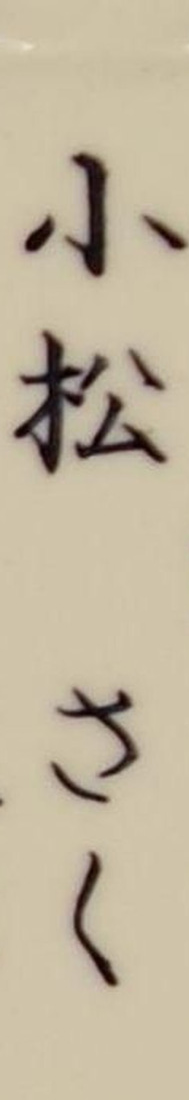小松さく
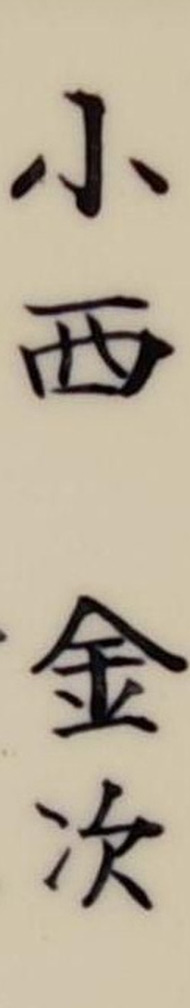小西金次
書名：E~L
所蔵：高野山金剛峯寺
